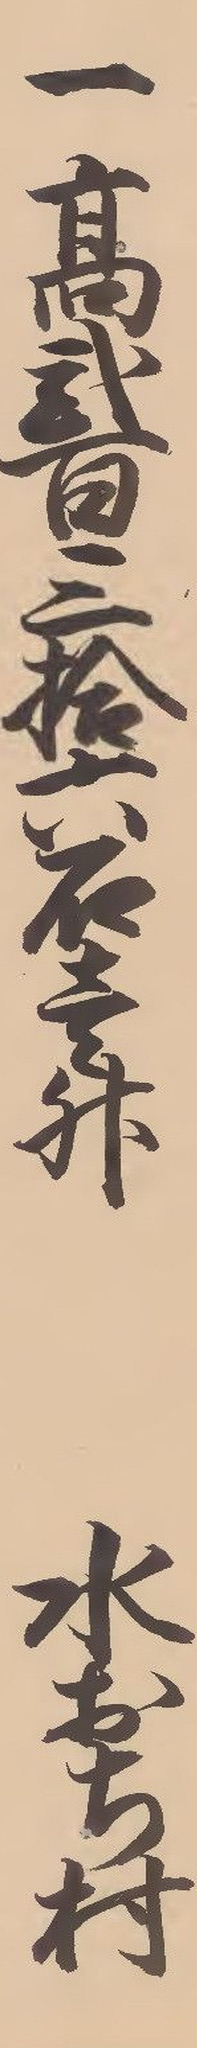一高弐百三拾六石壱升水おち村
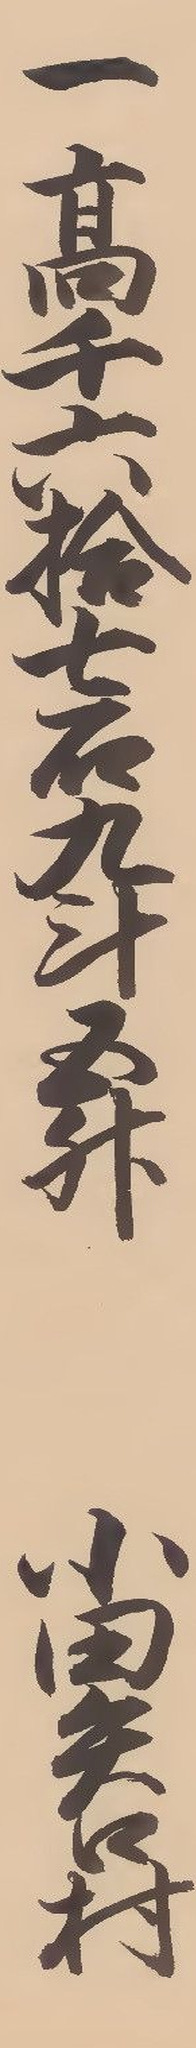一高千六拾七石九斗五升小田矢口村
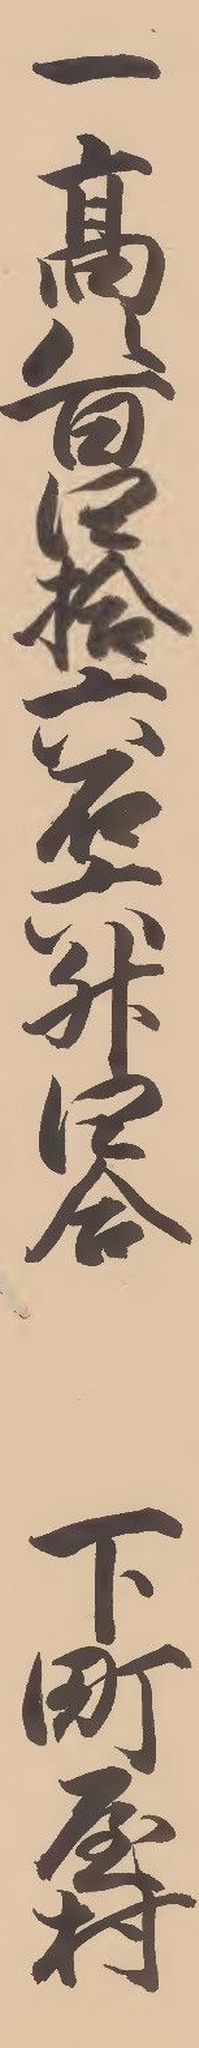一高八百四拾六石六升四合下町屋村
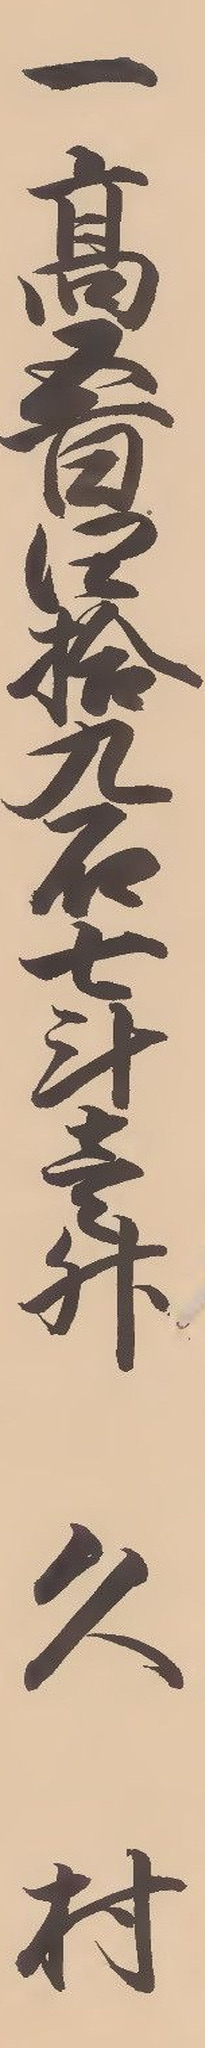一高五百四拾九石七斗壱升久村
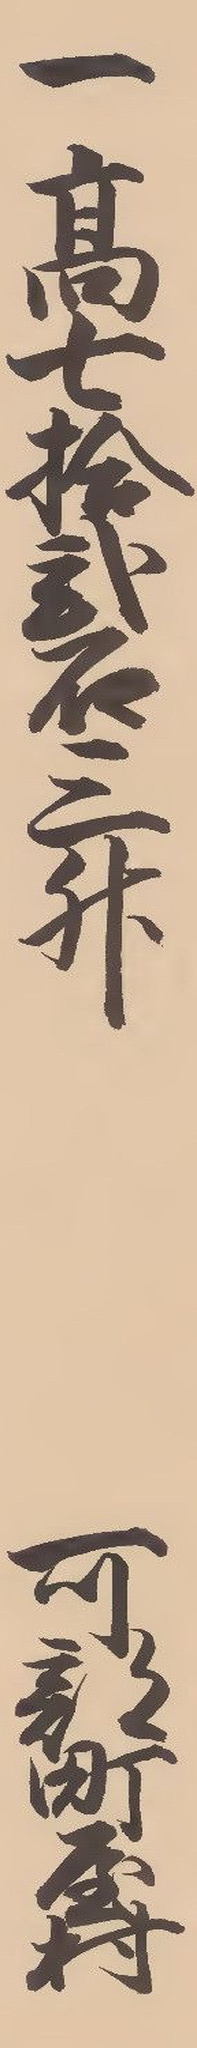一高七拾弐石三升可部町屋村
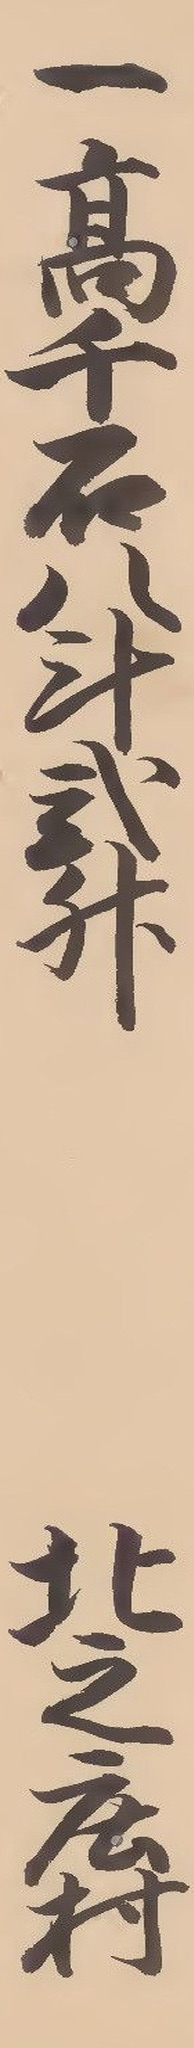一高千石八斗弐升北之庄村
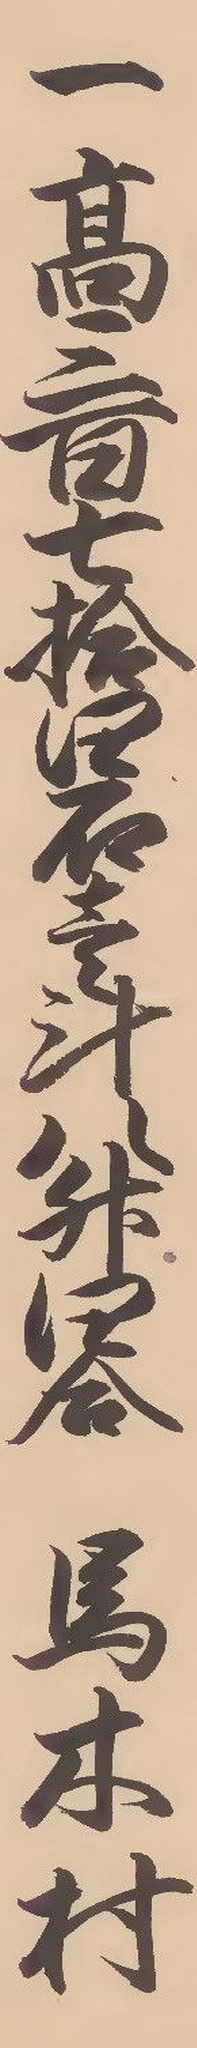一高三百七拾四石壱斗八升四合馬木村

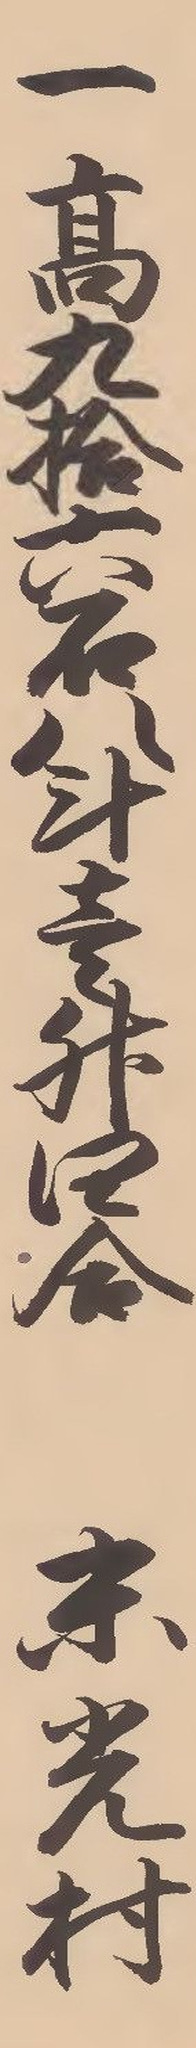一高九拾六石八斗壱升四合末光村
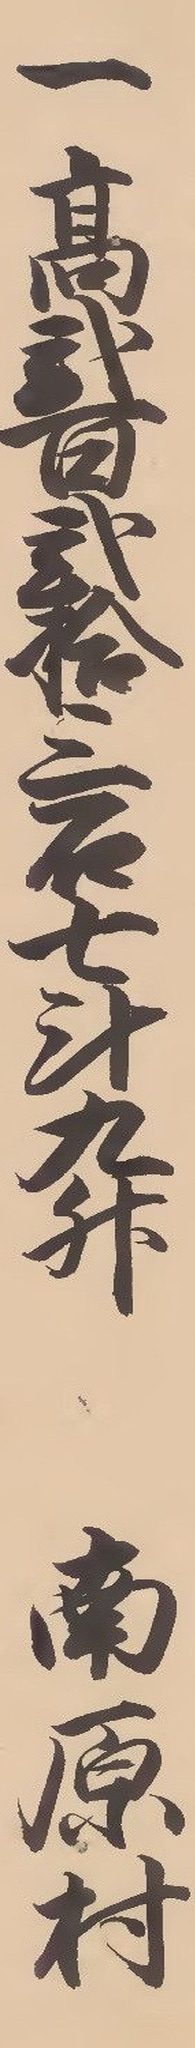一高弐百弐拾三石七斗九升南原村
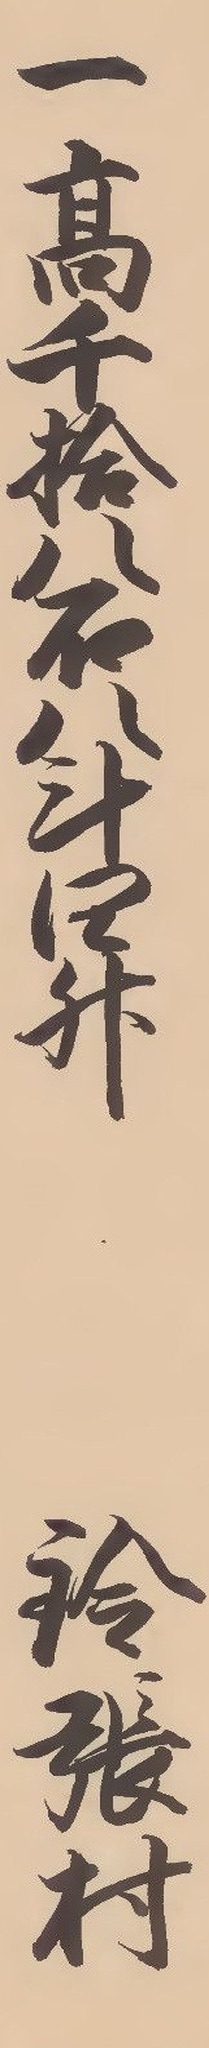一高千拾八石八斗四升鈴張村
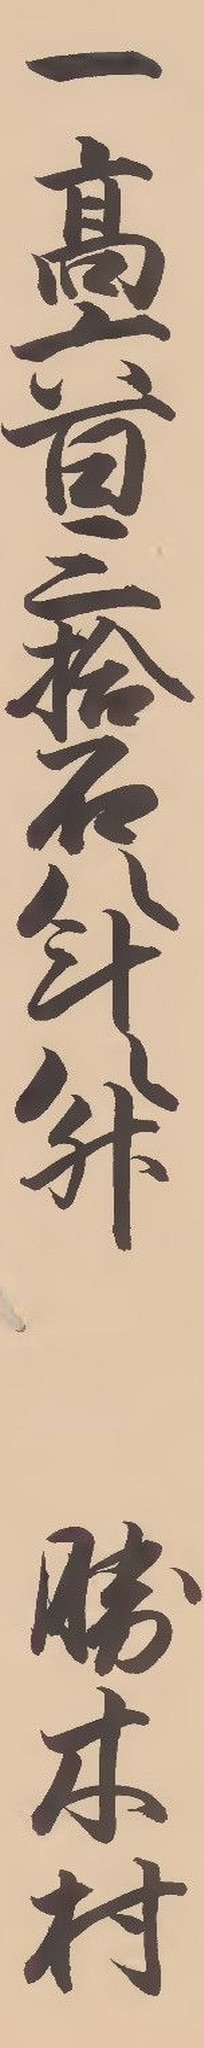一高六百三拾石八斗八升勝木村
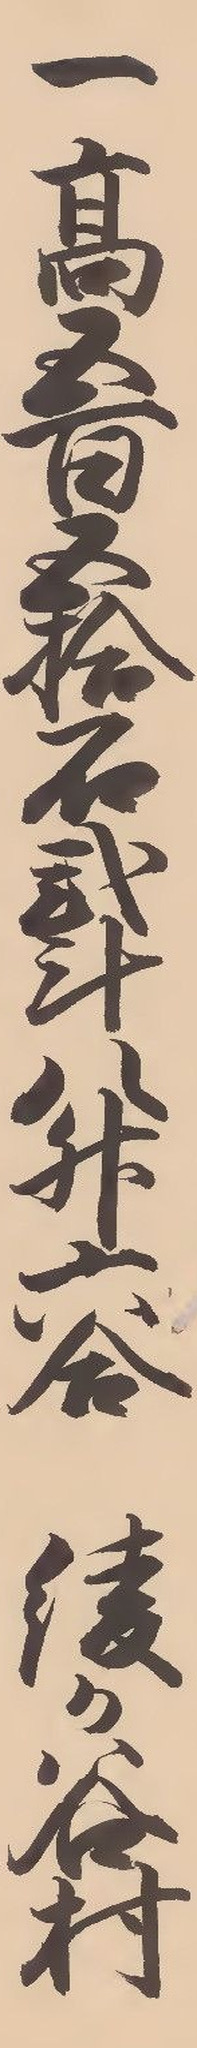一高五百五拾石弐斗八升六合綾ゕ谷村
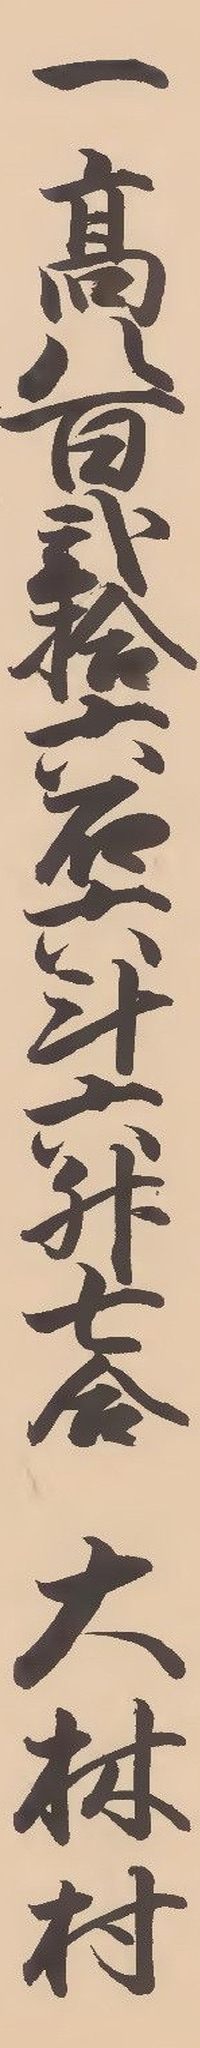一高八百弐拾六石六斗六升七合大林村
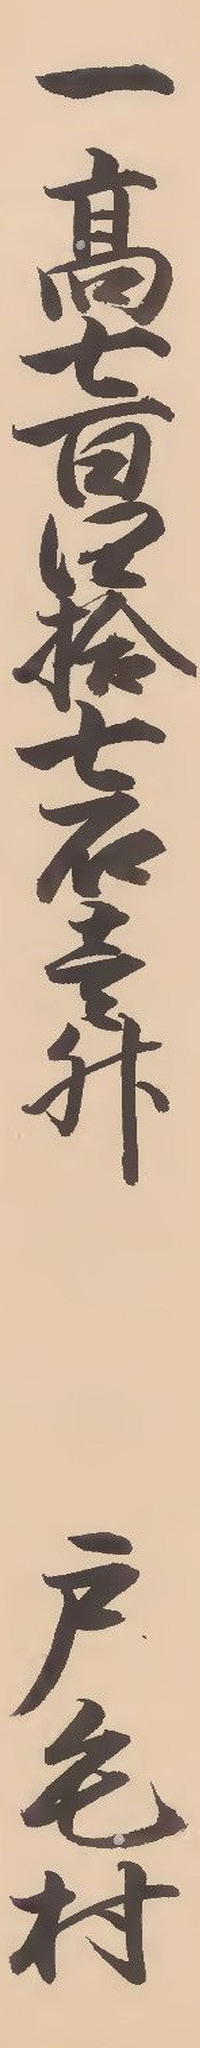一高七百四拾七石壱升戸毛村
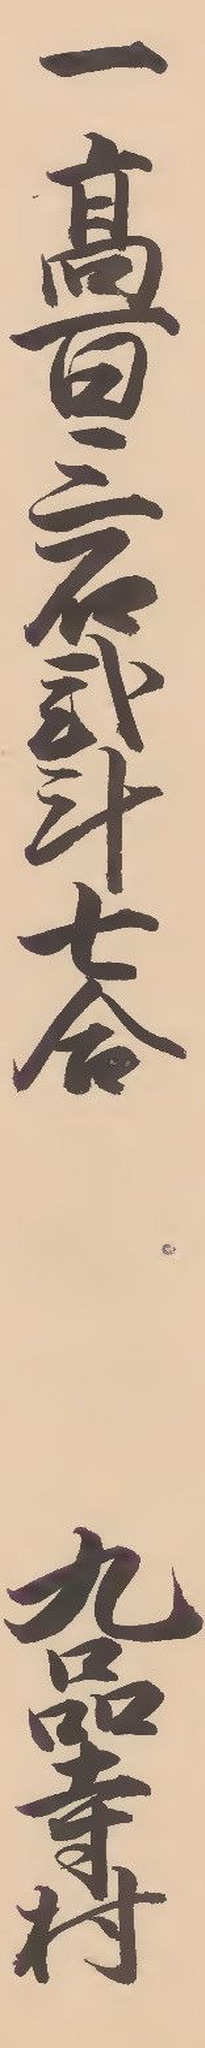一高百三石弐斗七合九品寺村

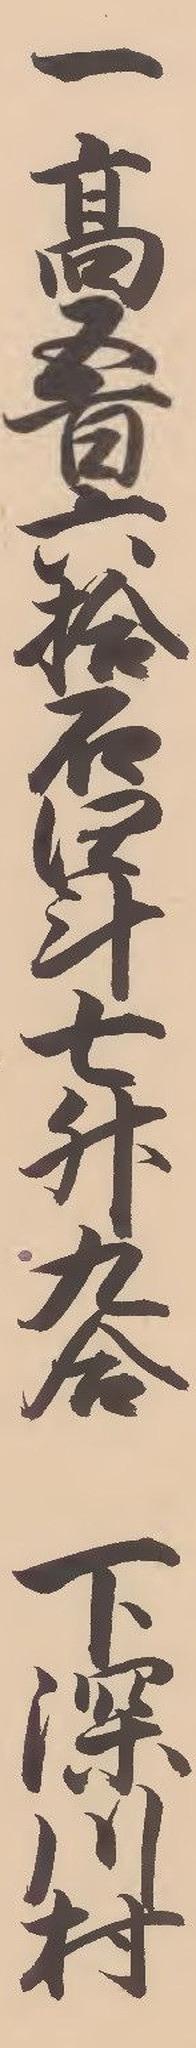一高五百六拾石四斗七升九合下深川村
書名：安芸国郷帳
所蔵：国立公文書館 National Archives of Japan
